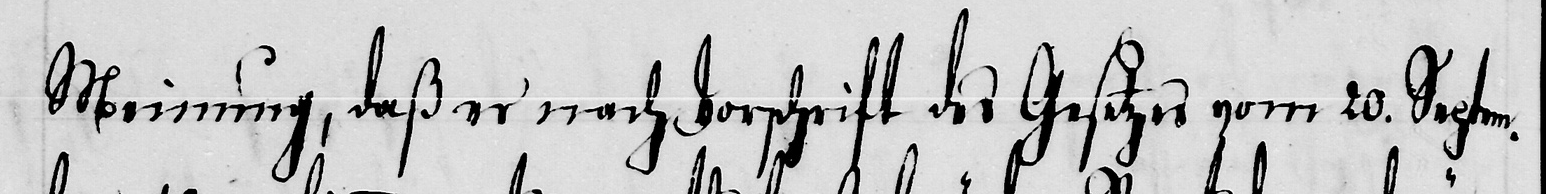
Meinung, daß er nach Vorschrift des Gesetzes vom 20. Septe¬
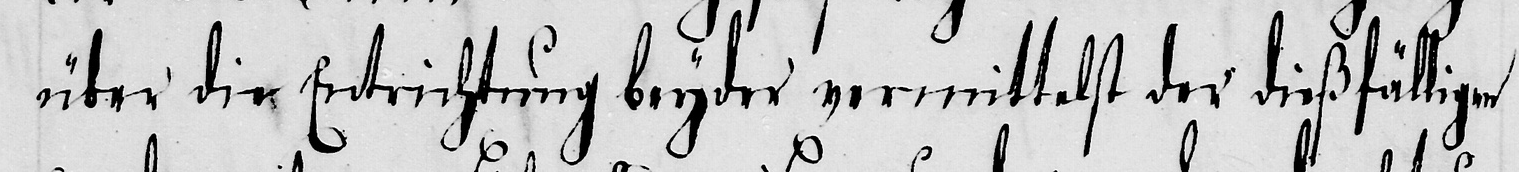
über die Entrichtung beyder vermittelst der dießfällig¬
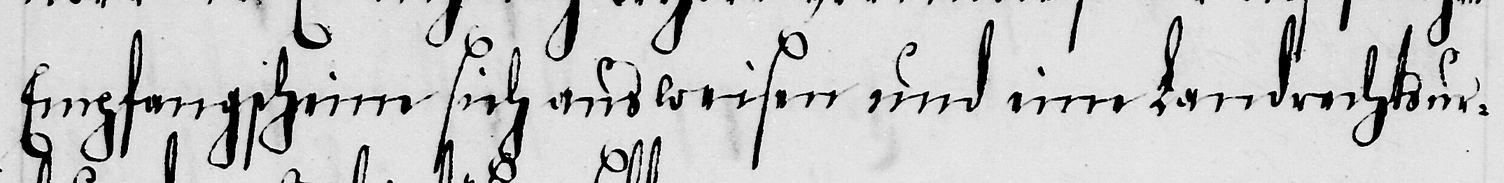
Empfangscheine sich ausweisen und eine Landrechtsur¬
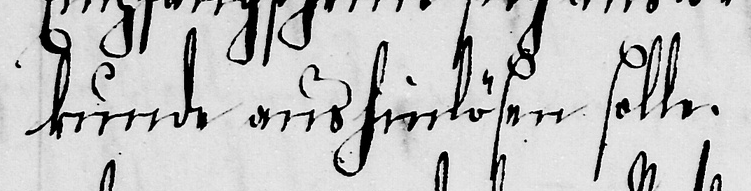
kunde aushinlösen solle.
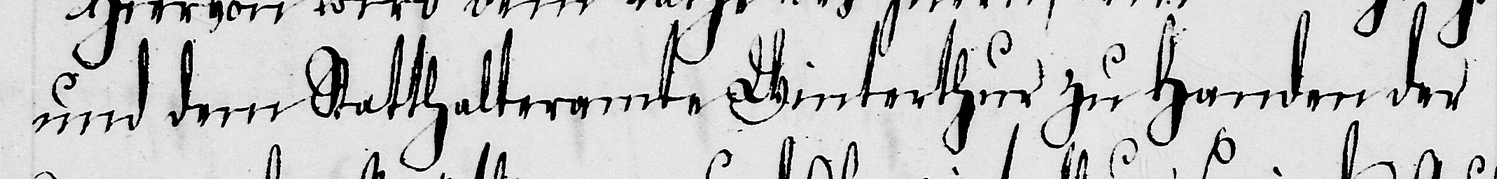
und dem Statthalteramte Winterthur zu Handen der
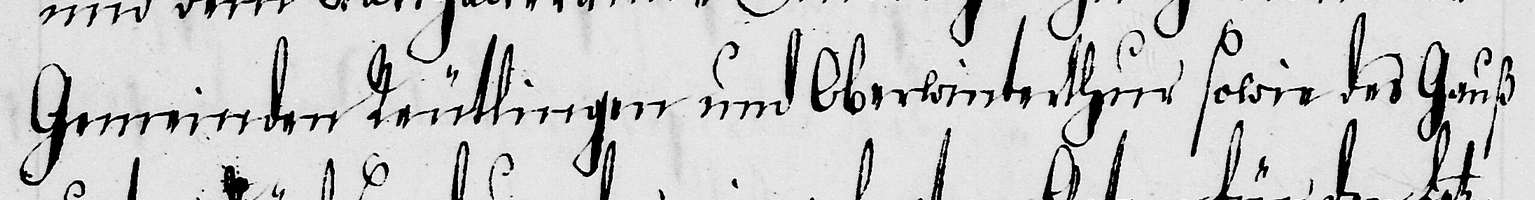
Gemeinden Reutlingen und Oberwinterthur sowie des Gauß
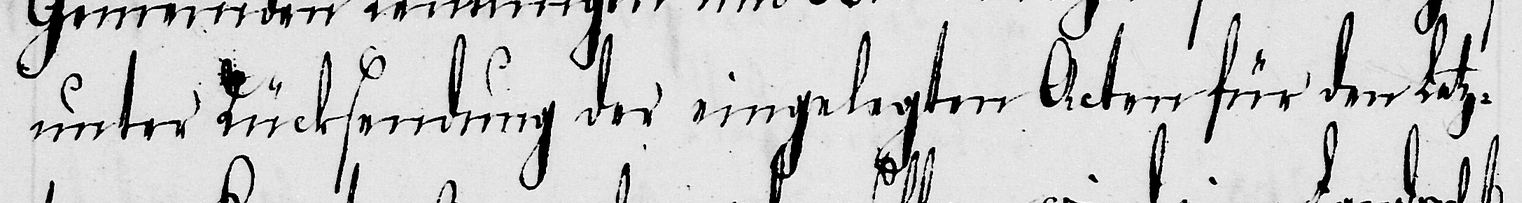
unter Rücksendung der eingelegten Acten für den Letz¬
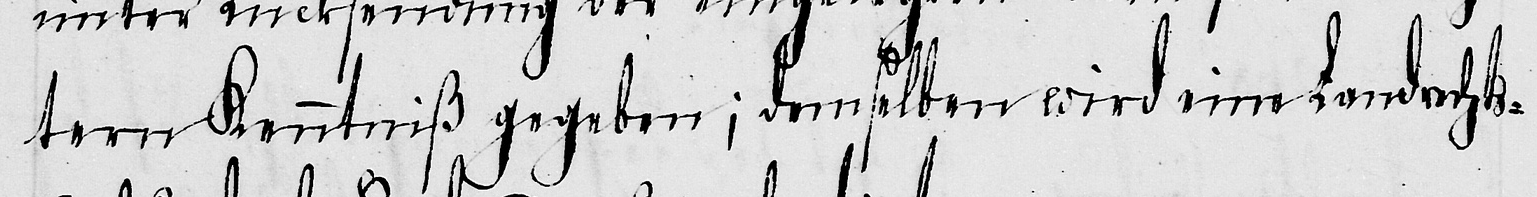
tern Kenntniß gegeben; demselben wird eine Landrechts¬
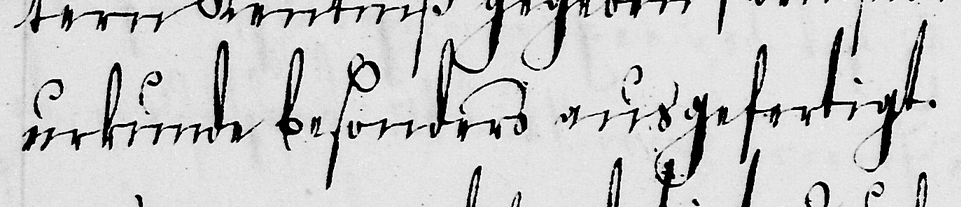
urkunde besonders ausgefertigt.
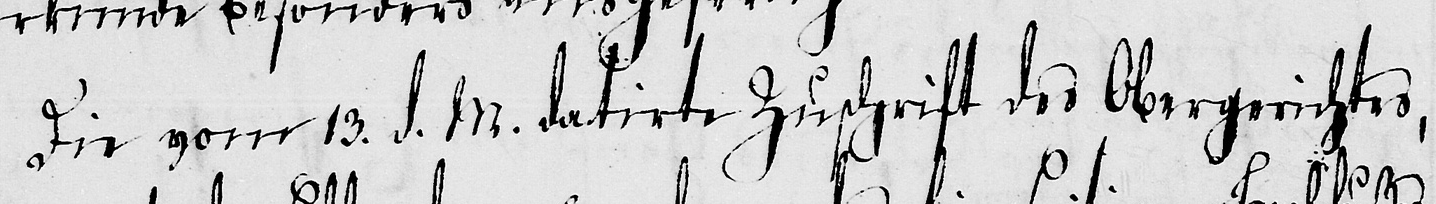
Die vom 13. d. M. datirte Zuschrift des Obergerichtes,
